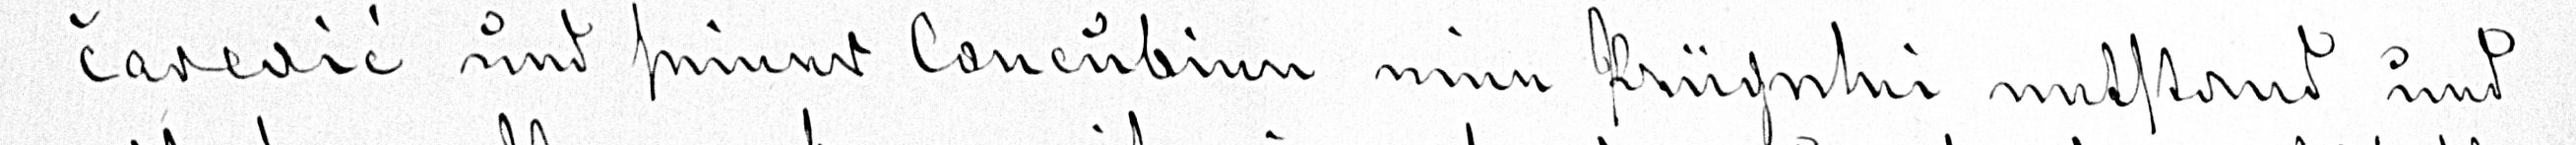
čarević und seiner Concubien eine Prügelei entstand und
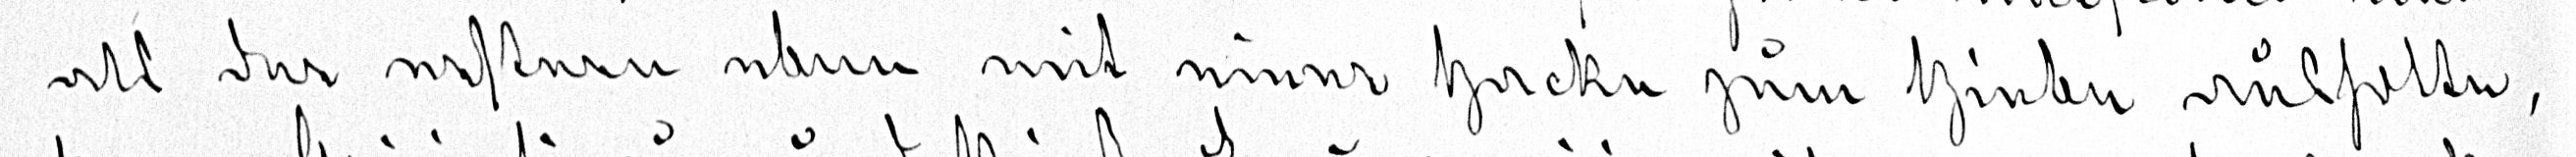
als der erstere eben mit einer Hacke zum Hiebe ausholte,
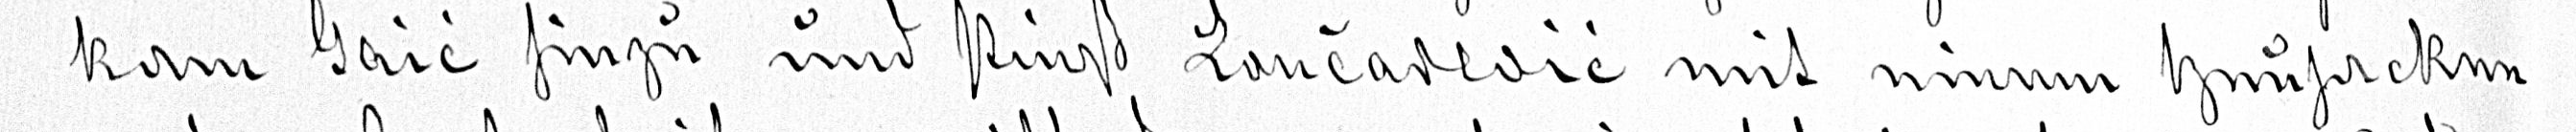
kam Gaić hinzu und stieß Lončarević mit einem Hausacken
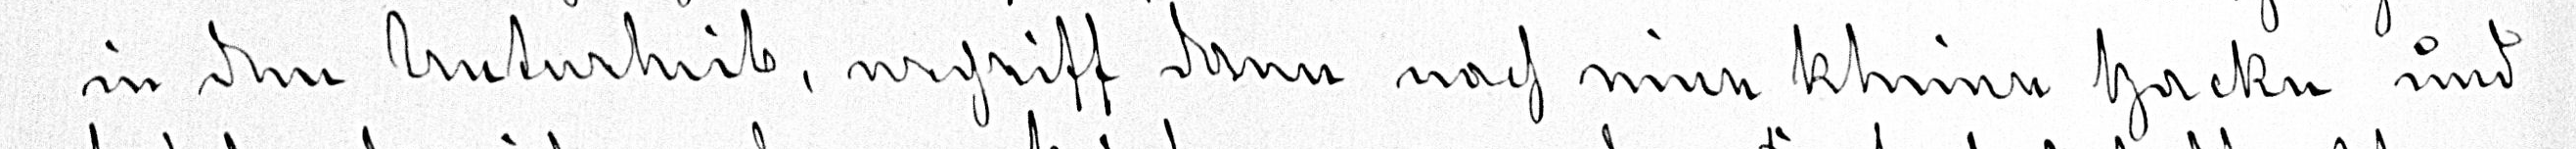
in den Unterleib, ergriff dann nach eine kleine Hacke und
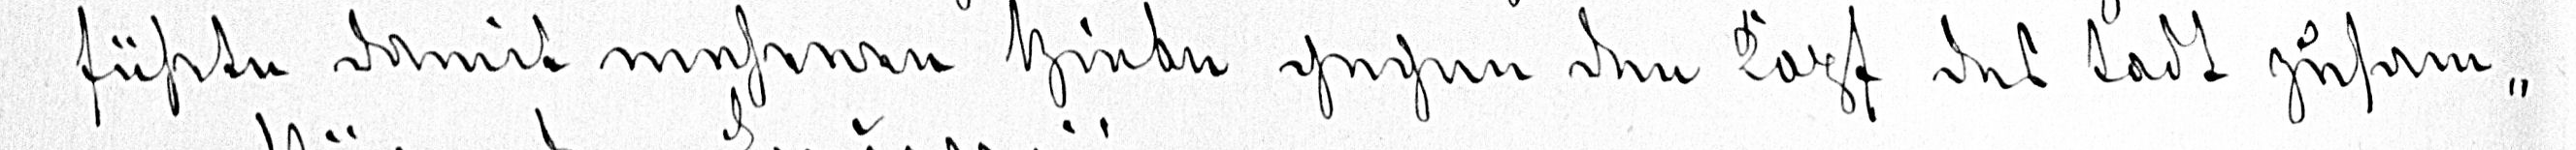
führte damit mehrere Hiebe gegen den Kopf des todt zusam¬
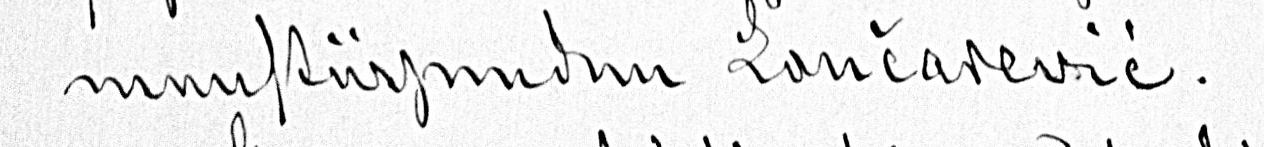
menstürzenden Lončarević.
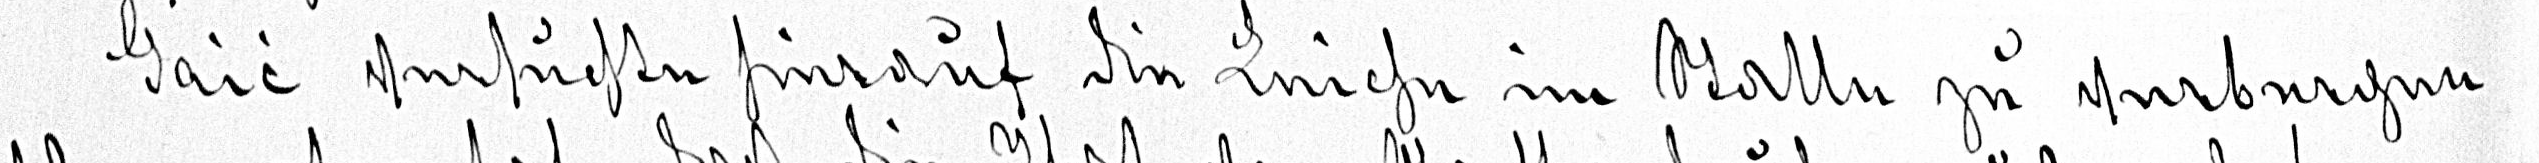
Gaić versuchte hierauf die Leiche im Stalle zu verbergen
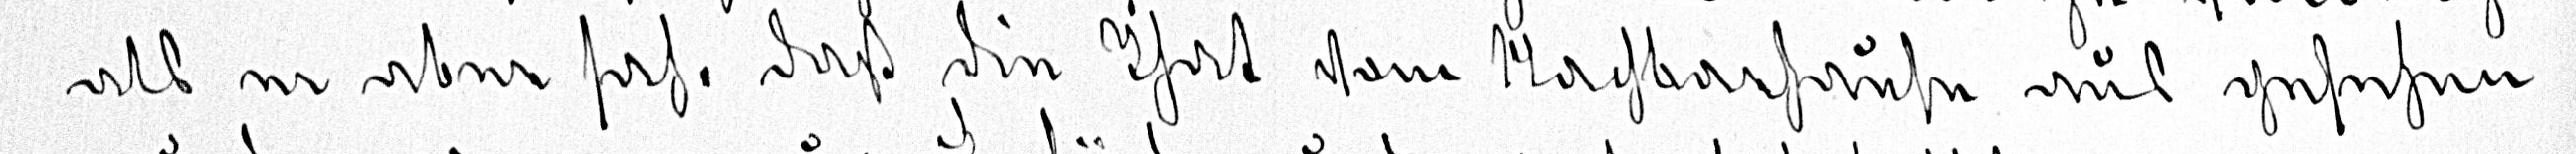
als er aber sah. daß die That vom Nachbarhause aus gesehen
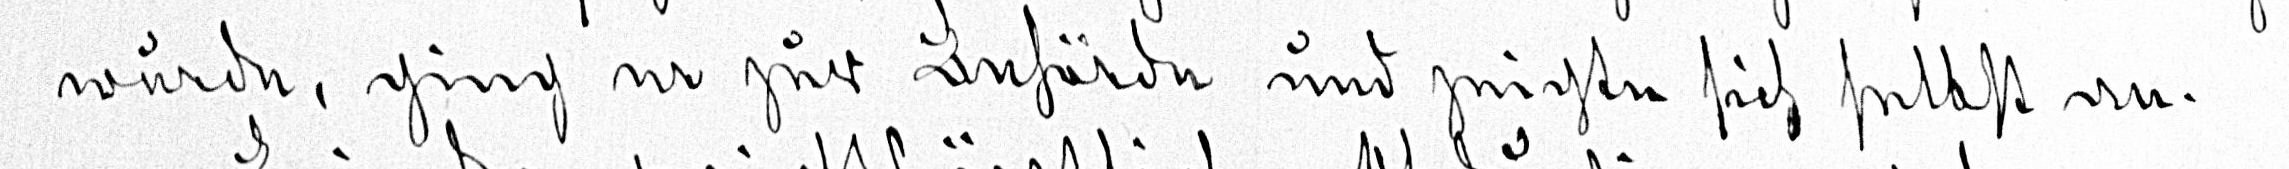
wurde, ging er zur Behörde und zeigte sich selbst an.
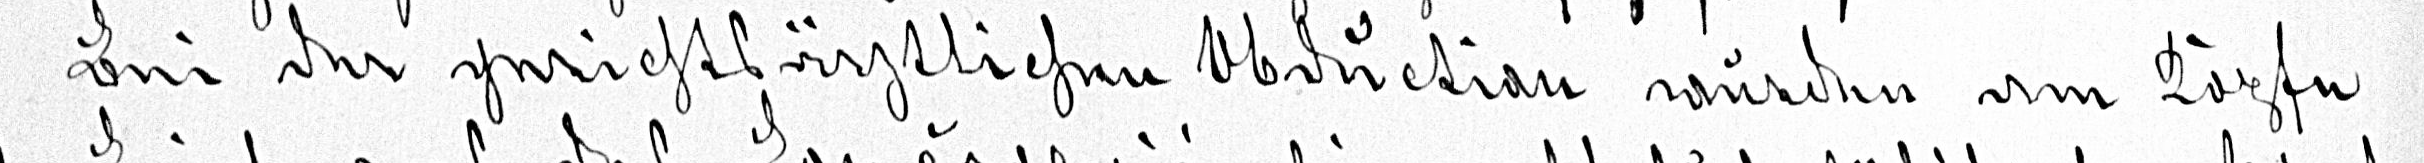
Bei der gerichtsärztlichen Obduction wurden am Kopfe
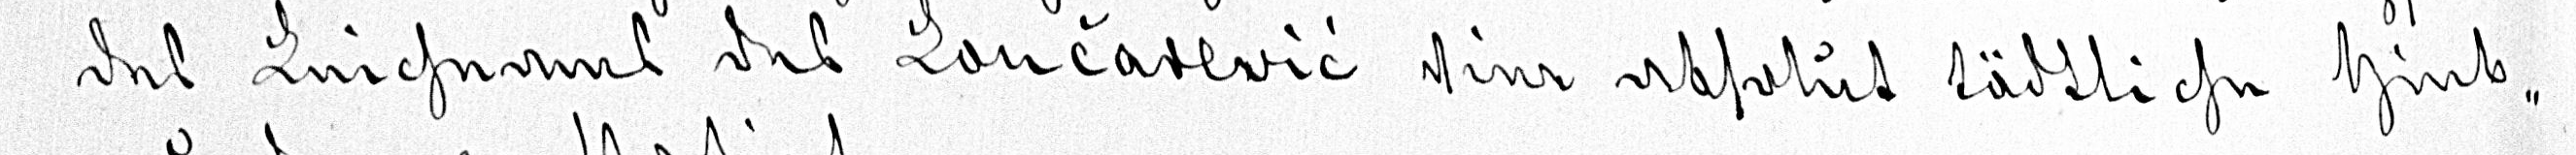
des Leichnams des Lončarević vier absolut tödtliche Hieb¬
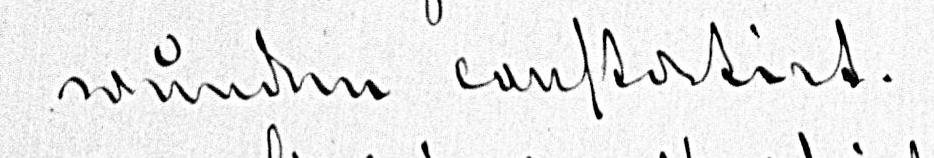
wunden constatirt.
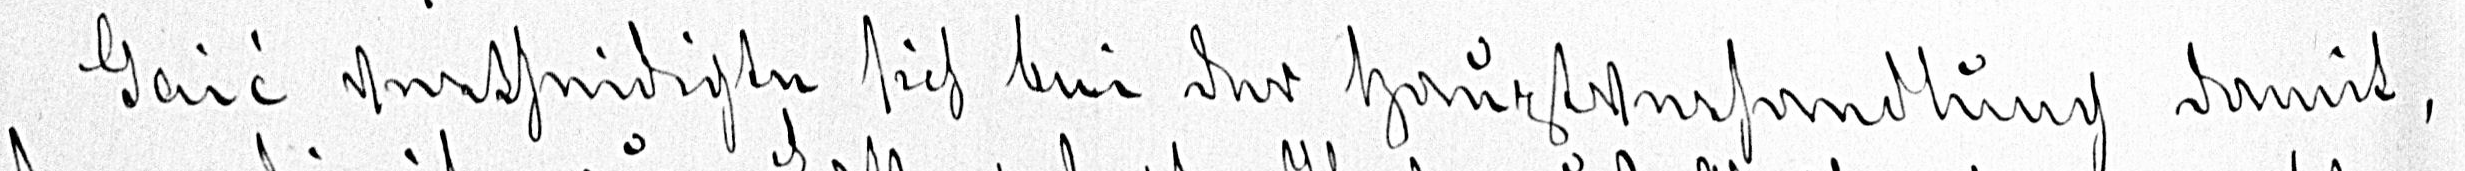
Gaić vertheidigte sich bei der Hauptverhandlung damit,
